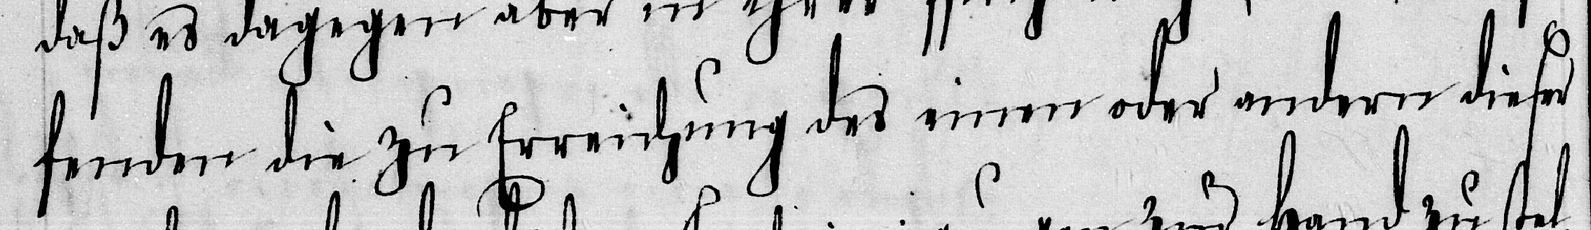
fenden die zu Erreichung des einen oder andern dieser
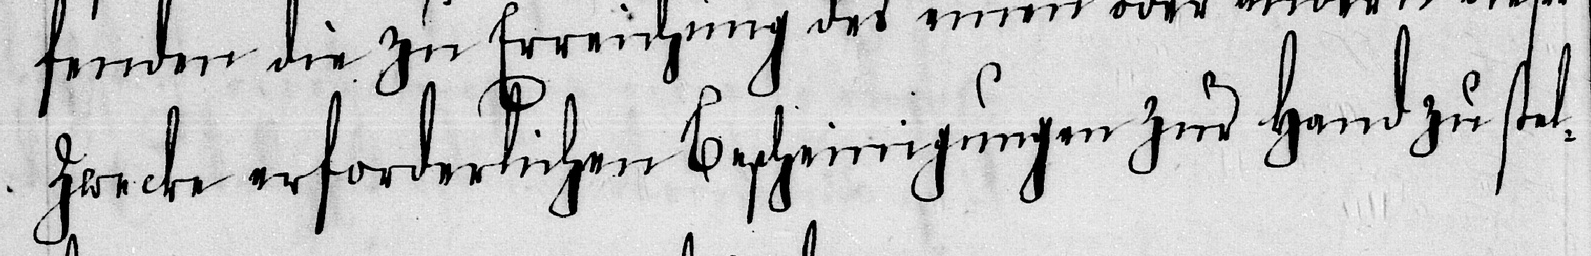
Zwecke erforderlichen Bescheinigungen zur Hand zu ste¬
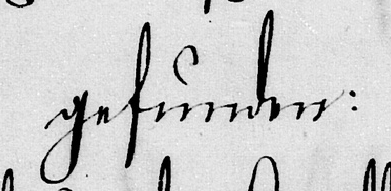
gefunden:
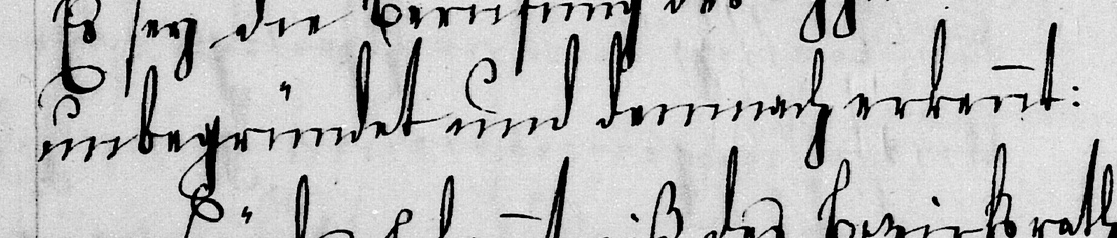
unbegründet und demnach erkennt:
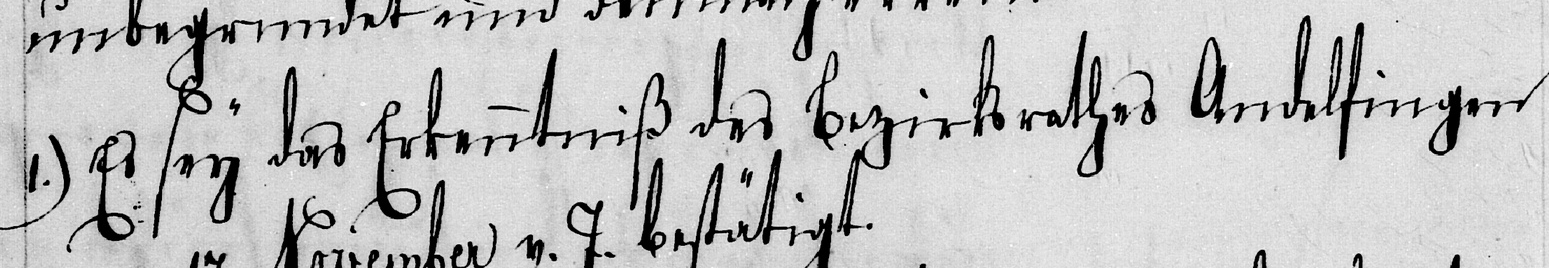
1.) Es sey das Erkenntniß des Bezirksrathes Andelfingen
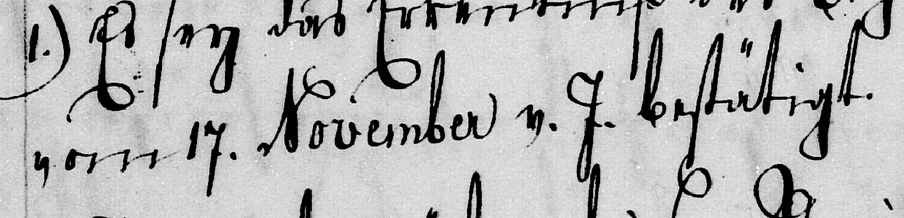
vom 17. November v. J. bestäti¬
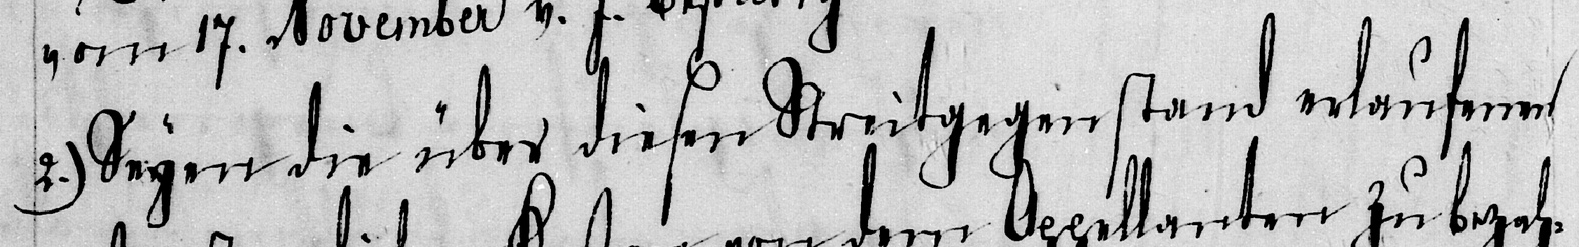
2.) Seyen die über diesen Streitgegenstand erlaufenen
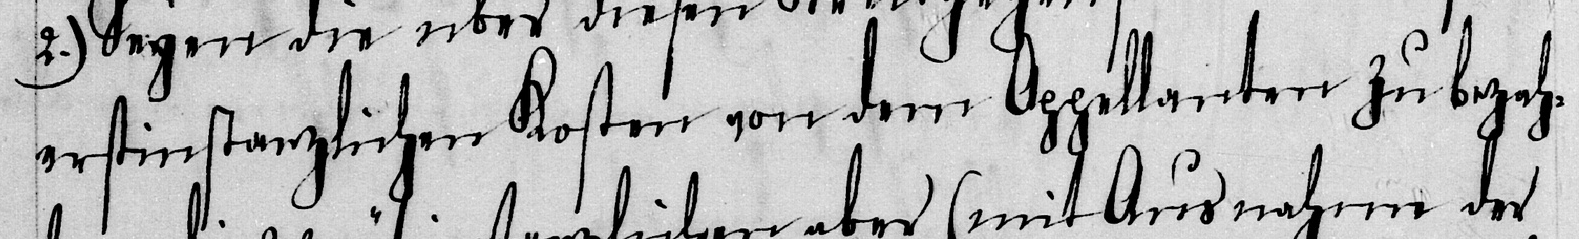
erstinstanzlichen Kosten von dem Appellanten zu bezah¬
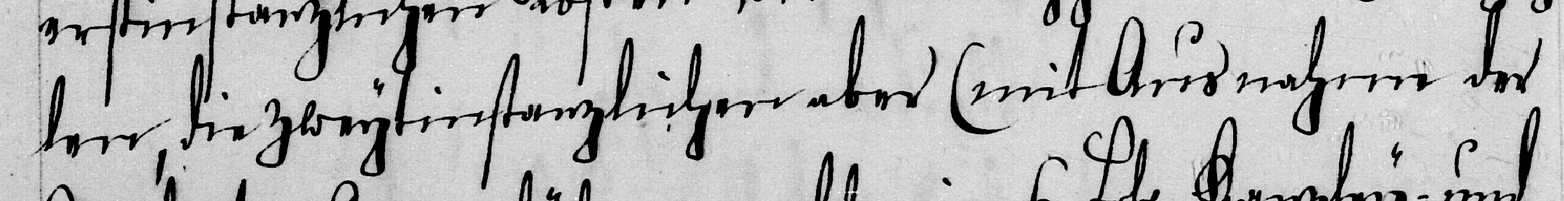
len, die zweytinstanzlichen aber (mit Ausnahme der
